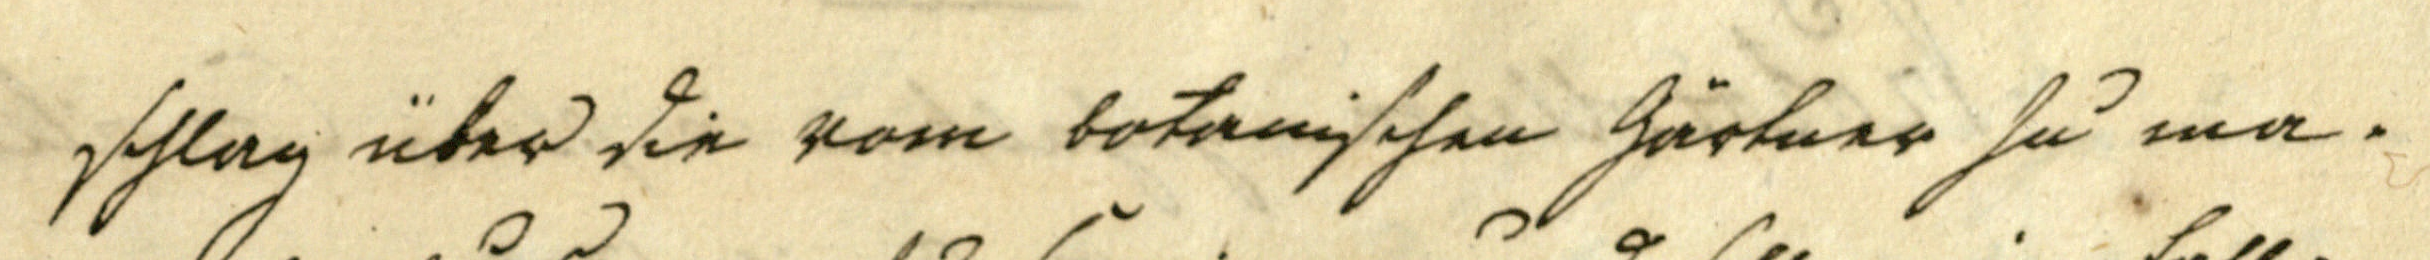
schlag über die vom botanischen Gärtner zu ma¬
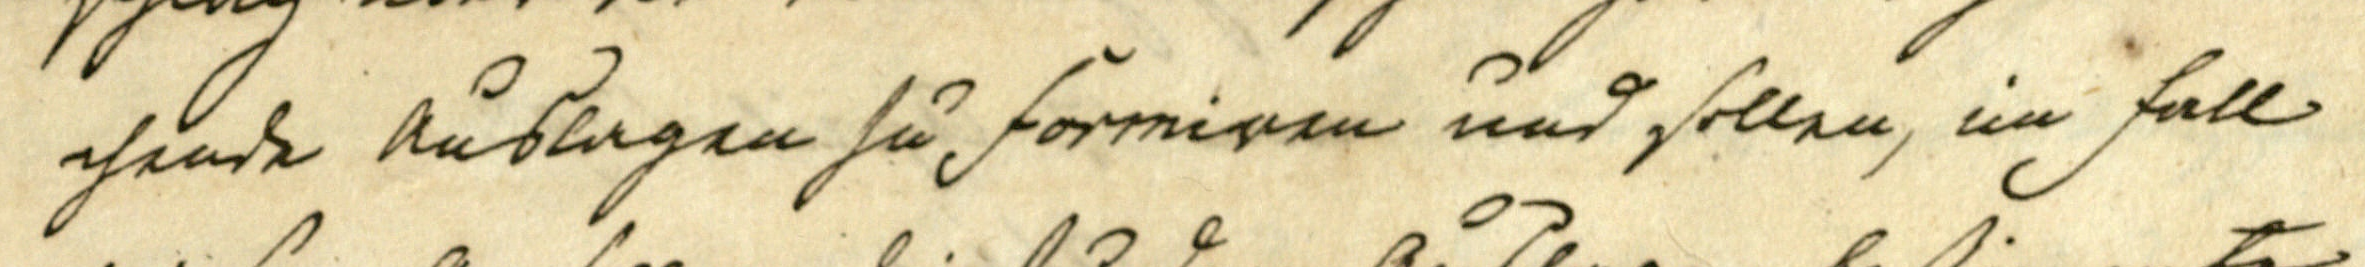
chende Auslagen zu formiren und sollen, im Fall
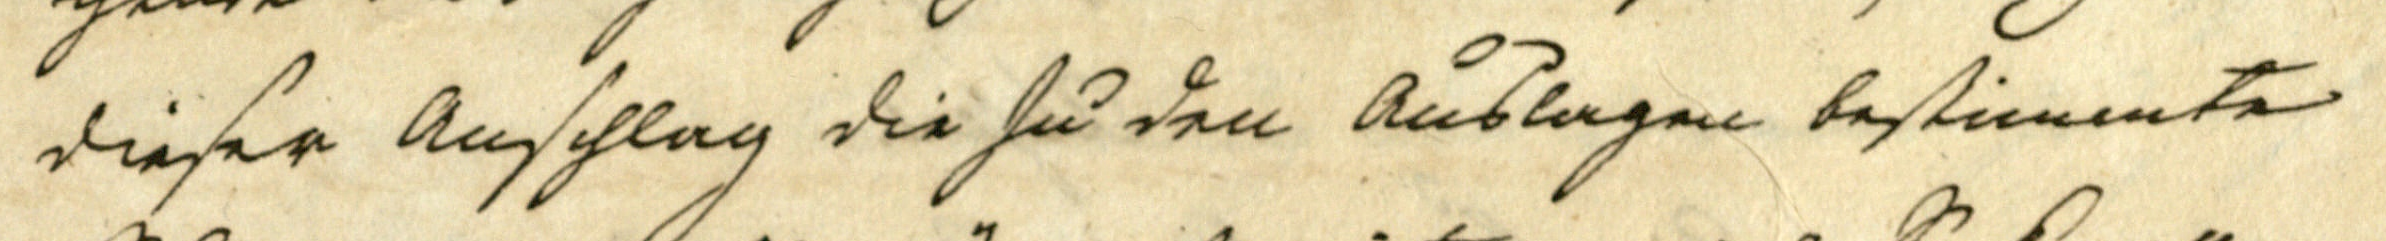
dieser Anschlag die zu den Auslagen bestimmte
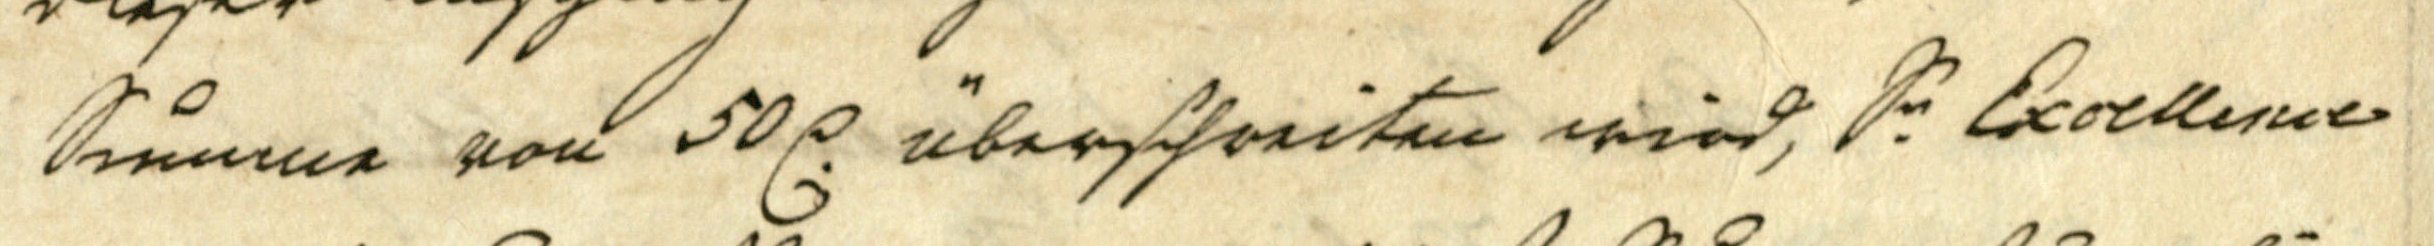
Summe von 50 l. überschreiten wird, Sr. Excellence
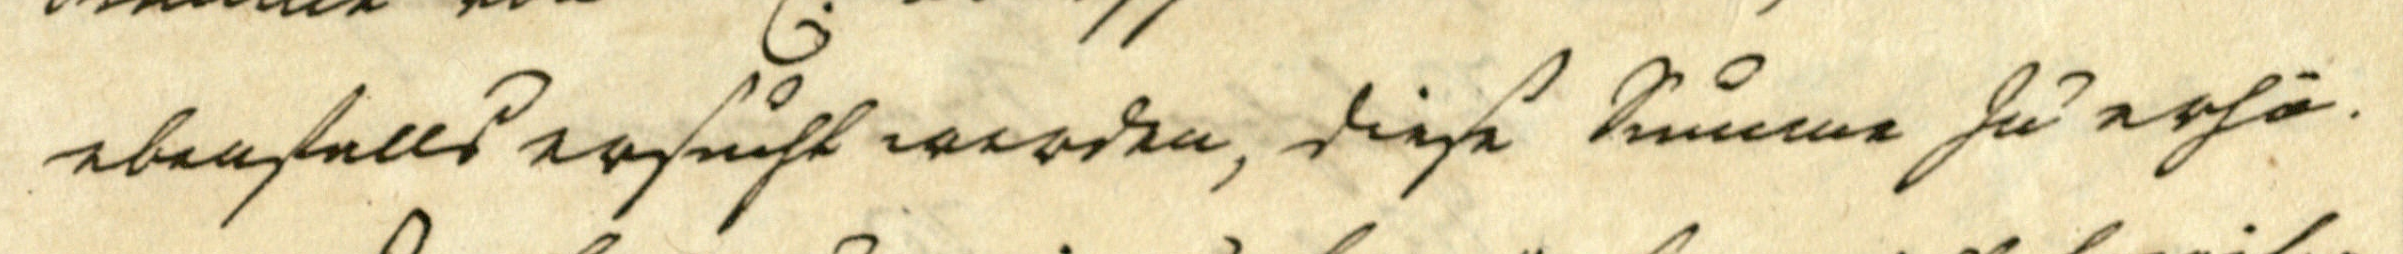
ebenfalls ersucht werden, diese Summe zu erhö¬
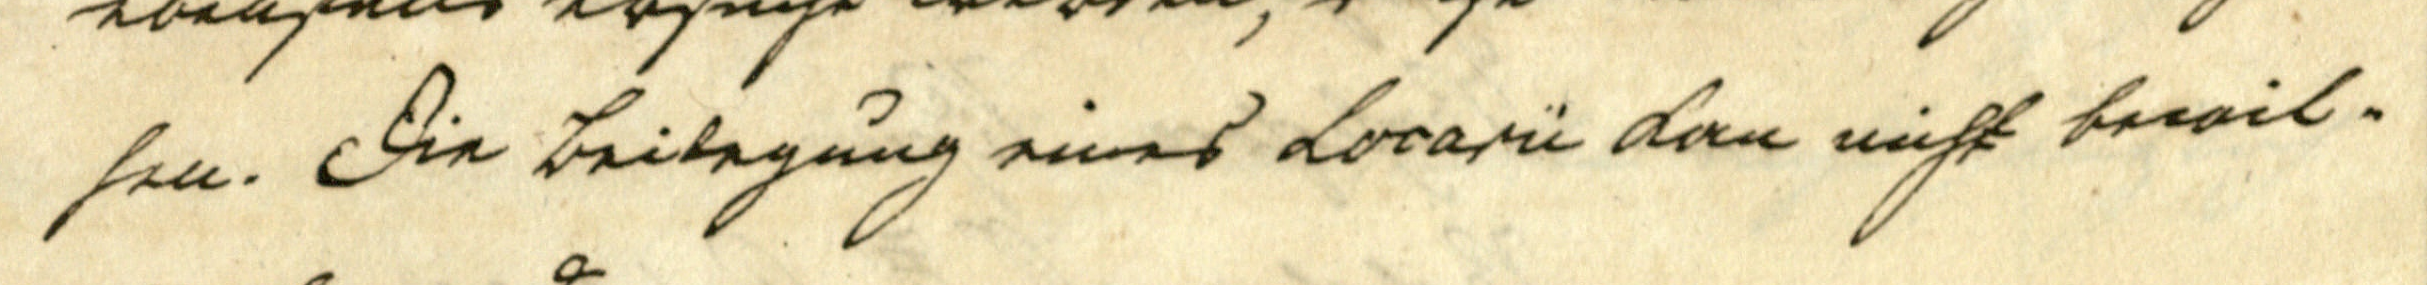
hen. Die Beilegung eines Locarii kan nicht bewil¬
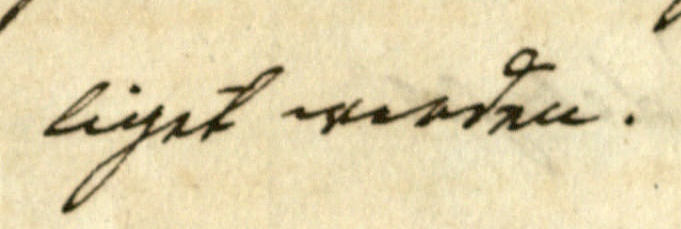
liget werden.
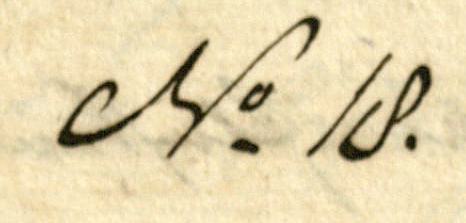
No 18.
